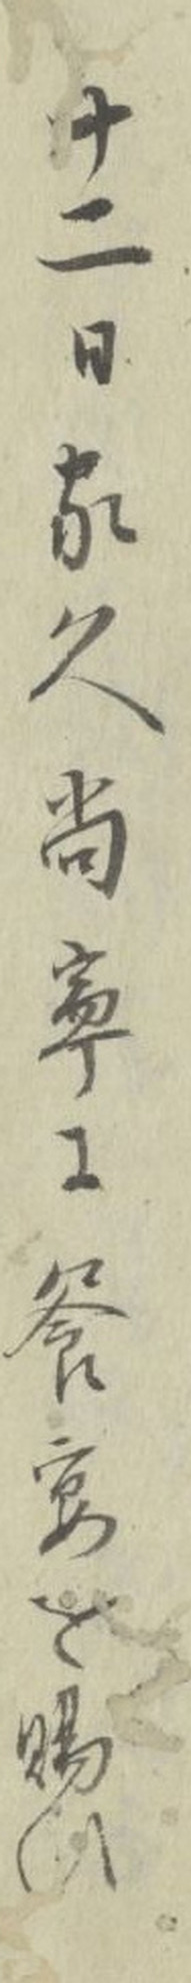十二日家久尚寧に饗宴を賜ひ
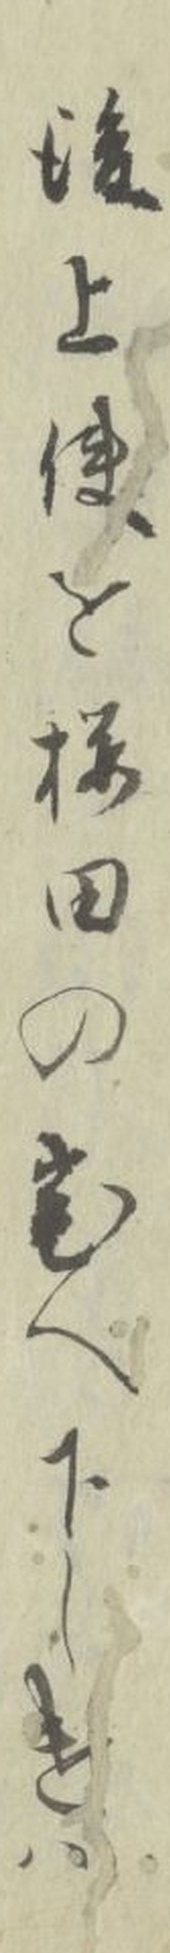後上使を桜田の宅へ下し遣は
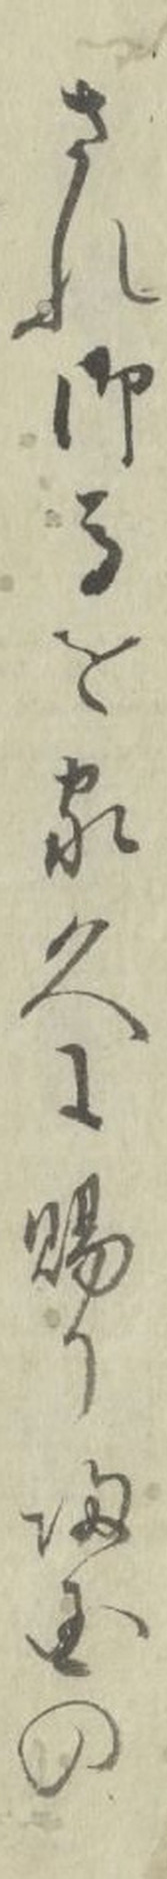され御馬を家久に賜り帰国の
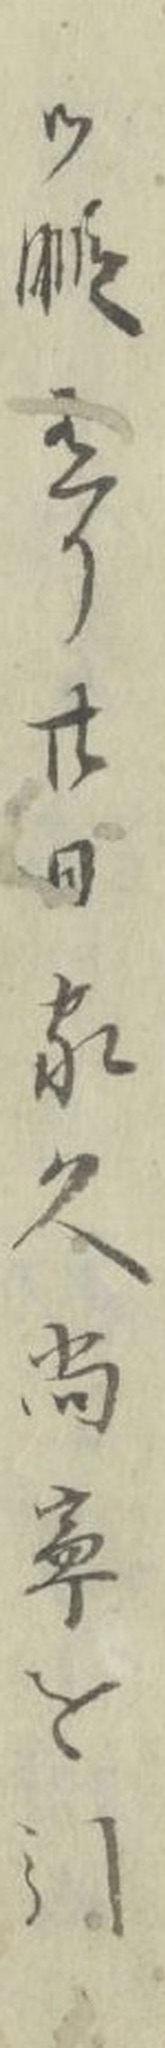御暇有り廿日家久尚寧を引

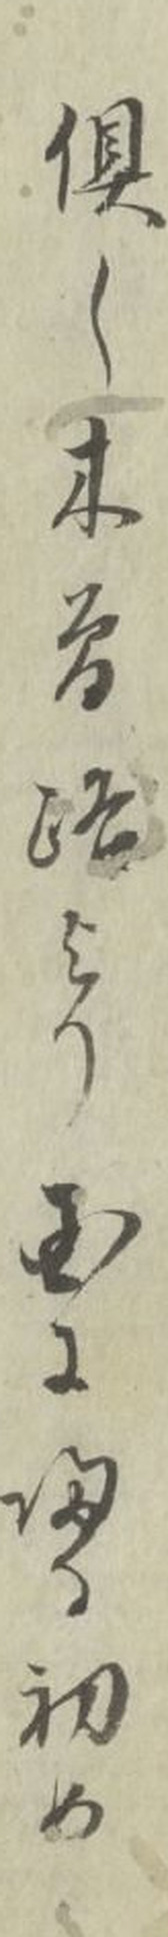倶し木曽路より国に帰る初め
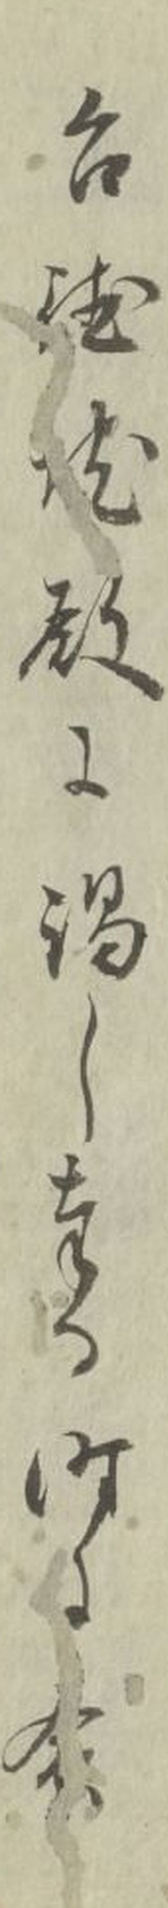台徳院殿に謁し奉る時に含
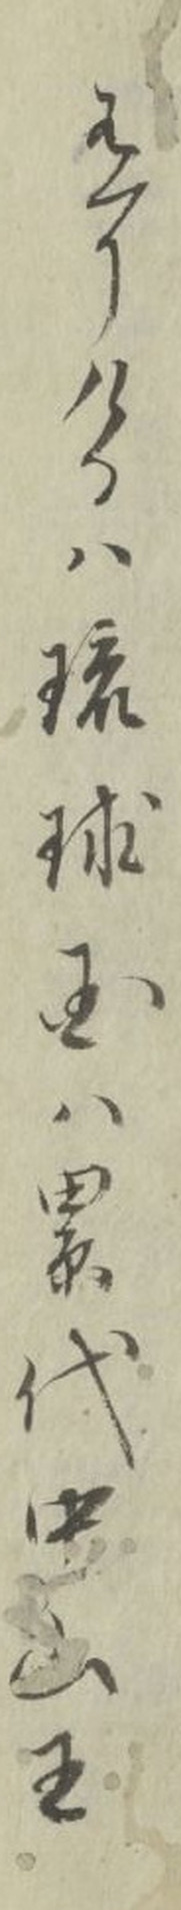有りけるは琉球国は累代中山王
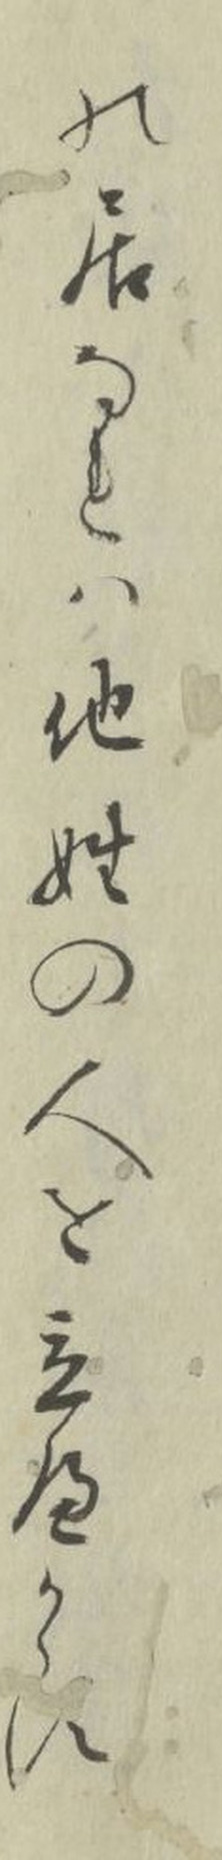の居なれは他姓の人を立へからす
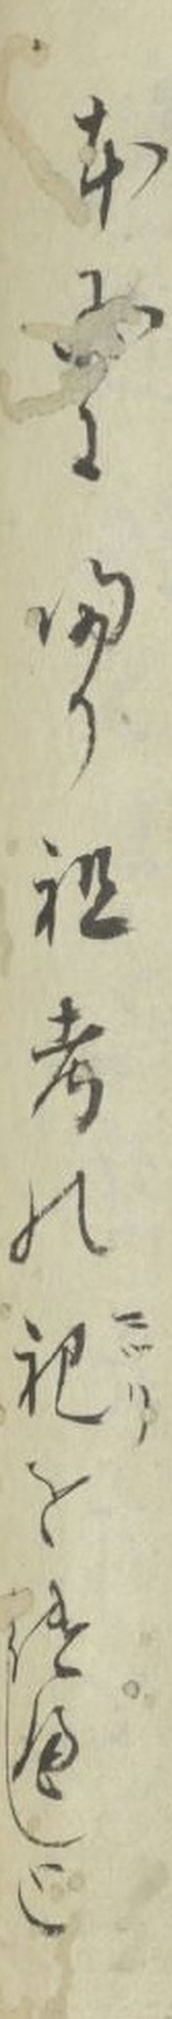本国に帰り祖考の祀を継へしと
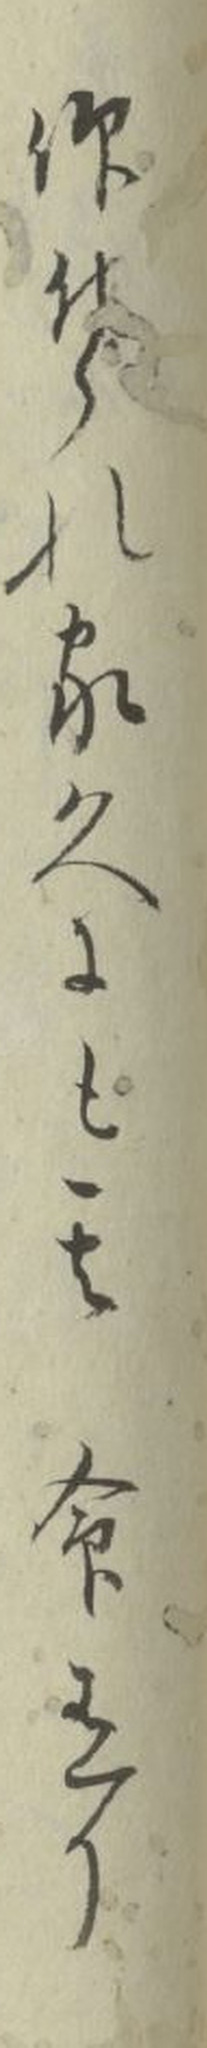仰付られ家久にも其命有り
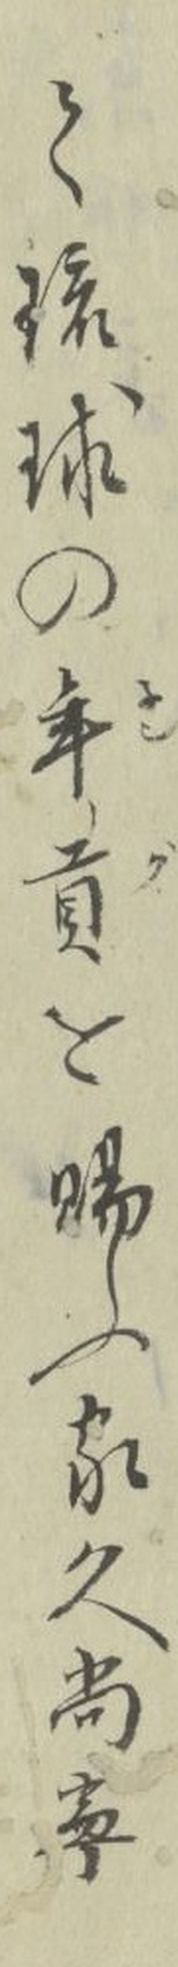て琉球の年貢を賜ふ家久尚寧
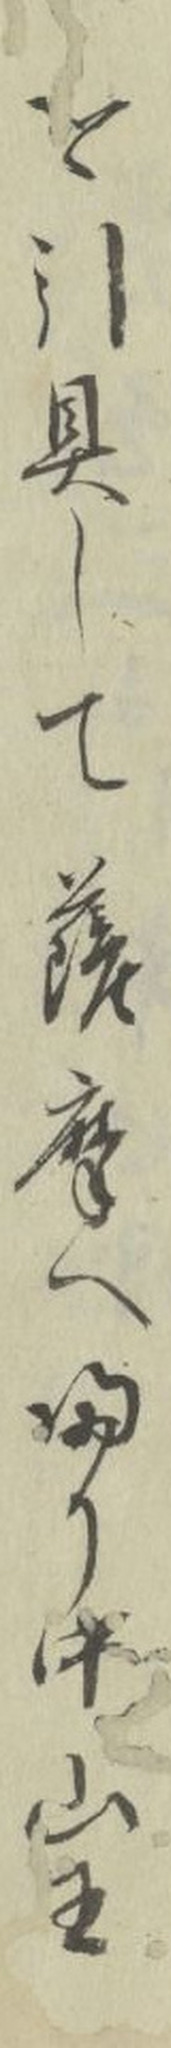を引具して薩摩へ帰り中山王
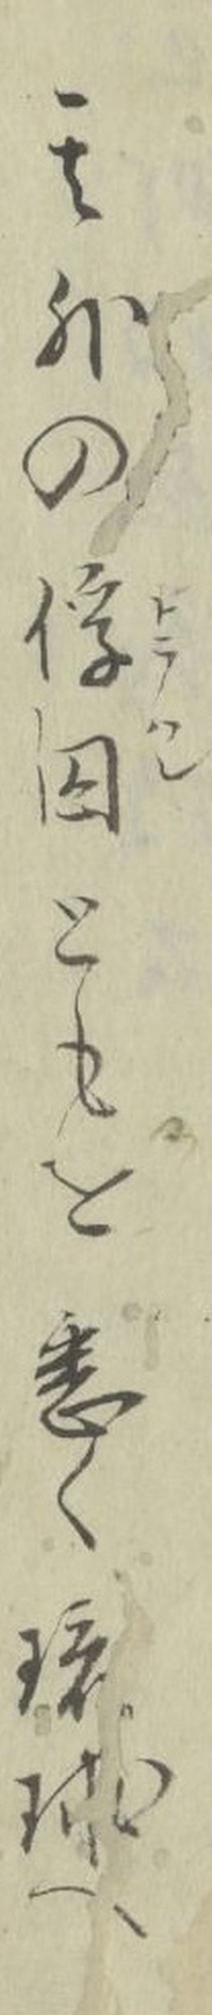其外の俘囚ともを悉く琉球へ
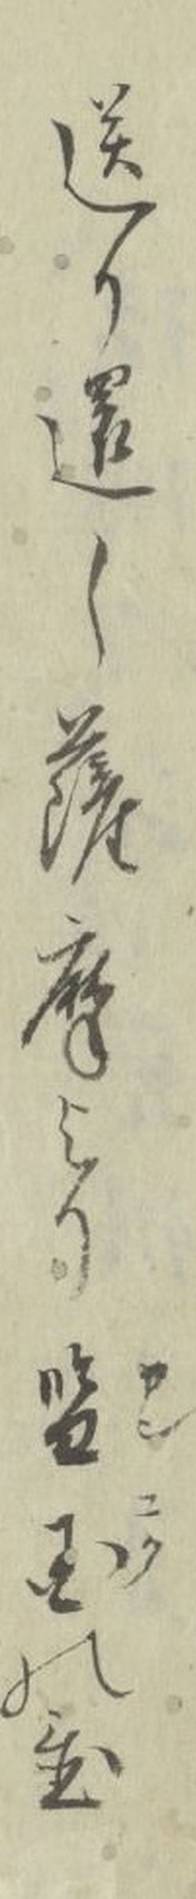送り還し薩摩より監国の置
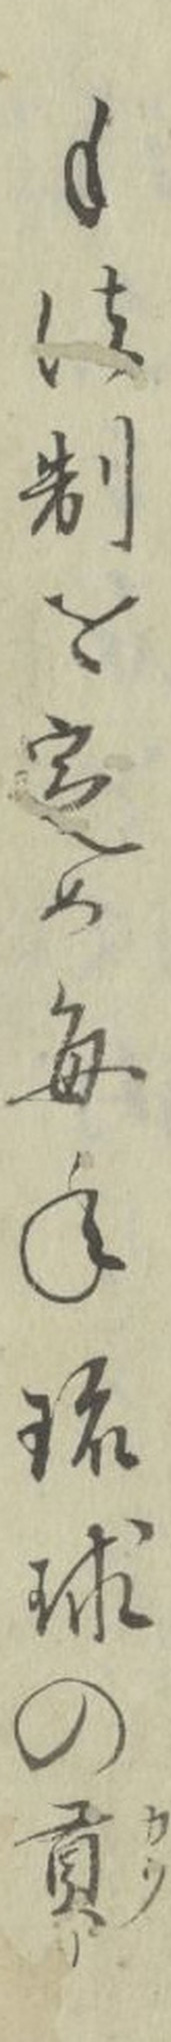手法制を定め毎年琉球の貢

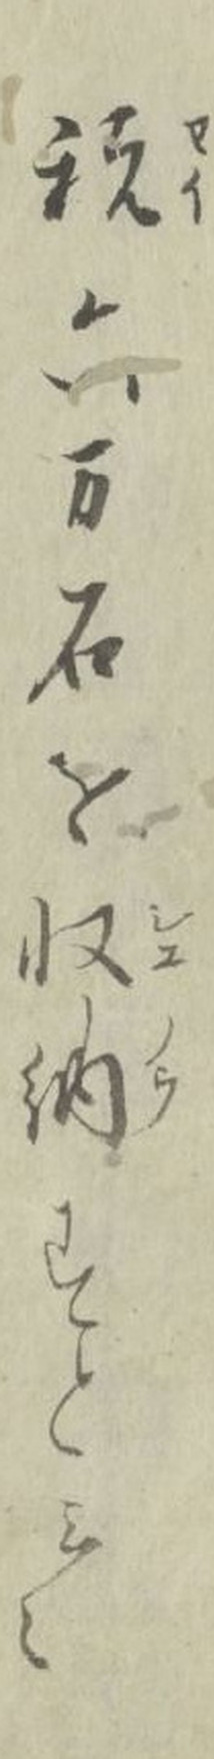税六万石を収納すと云々
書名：琉球来朝記 自一至七
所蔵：University of the Ryukyus Library
